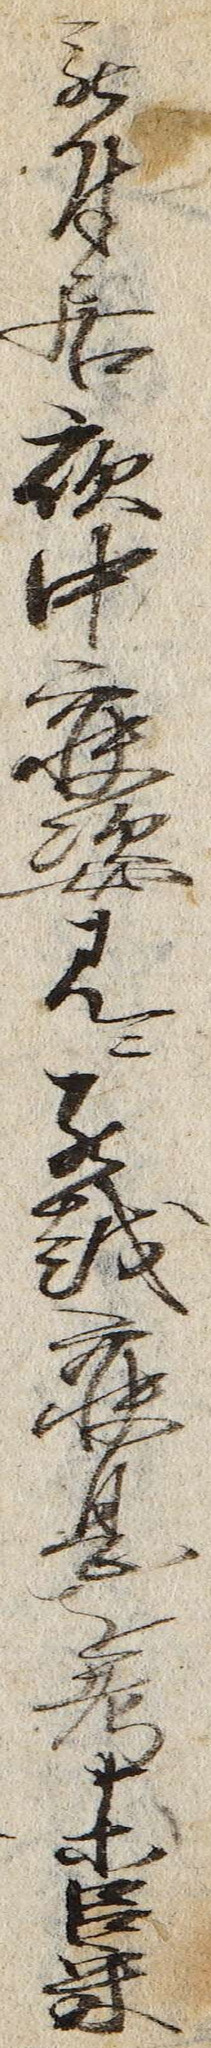被付居夜中寝姿見に罷越寝息を考申等呂宋
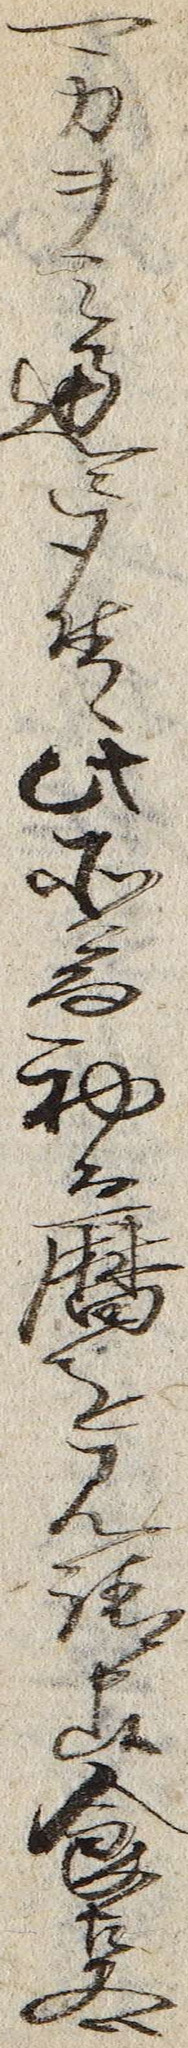マカヲの通に御座候此所にて初て暦を見請申候食事は
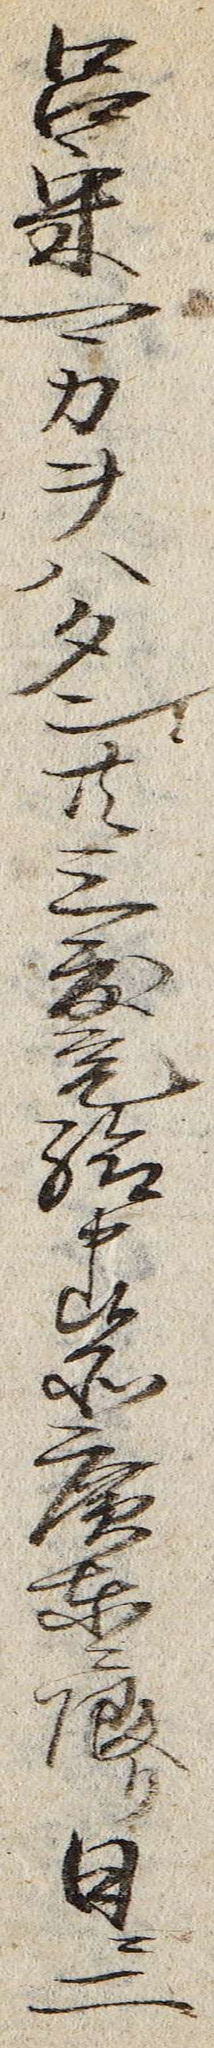呂宋マカヲハタンとも三度ずつ給申候所広東に限り日に二
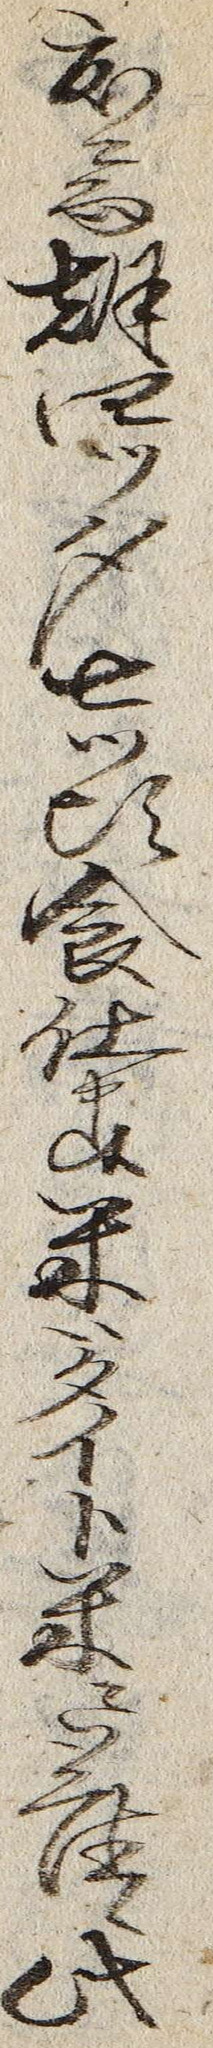度にて朝四つ夕七ツ頃食仕申候米はタイト米に御座候此
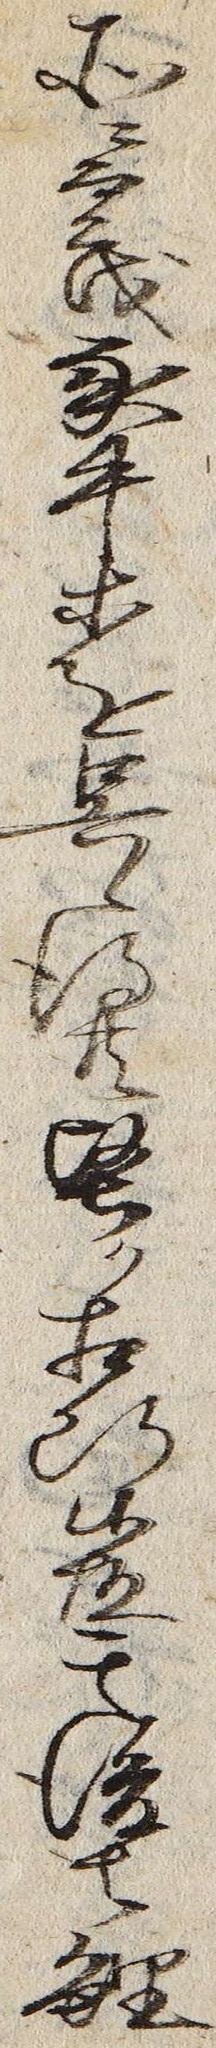所にても豕牛等を呉候得ども堅く相断候故其後は鯉
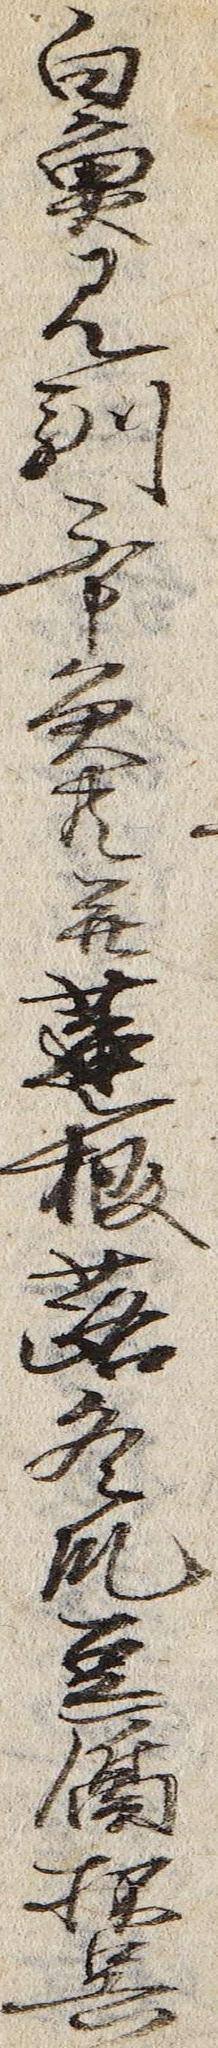白魚見馴不申魚ども幷蓮根蕗冬瓜豆腐抔呉
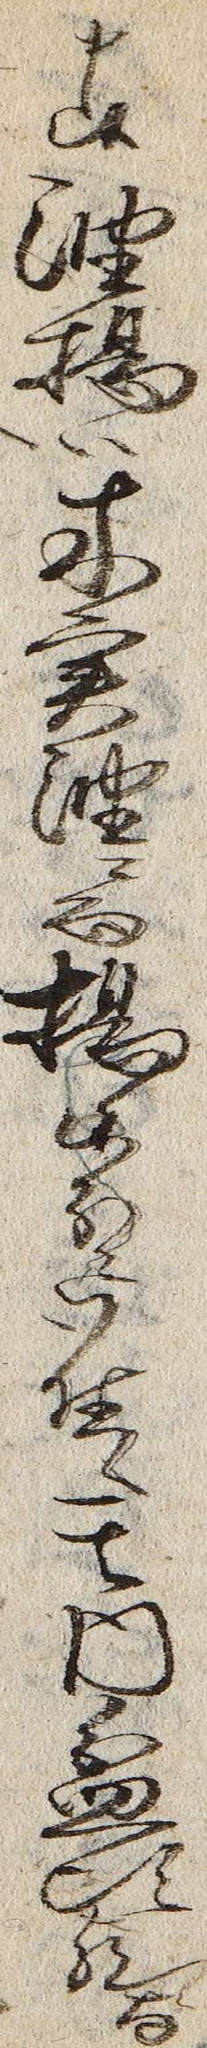申候油揚は木実油にて揚候分に御座候其内盆頃かと
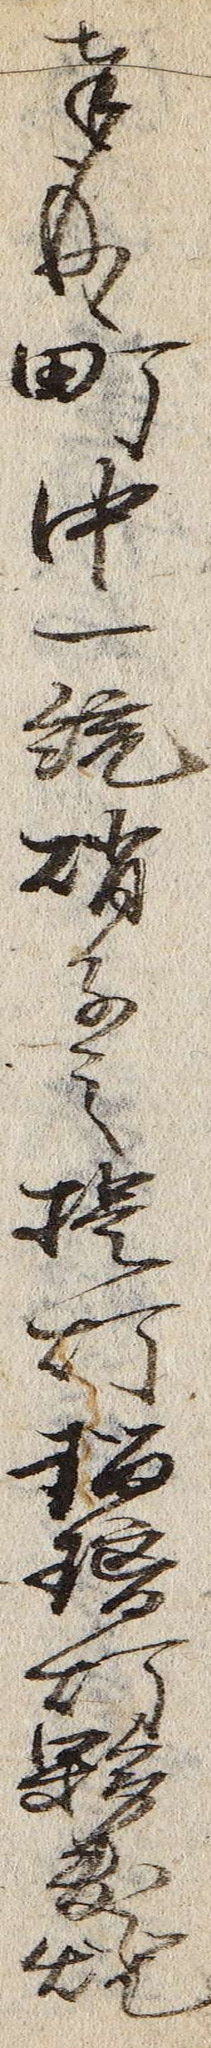奉存候町中一統硝子の提灯瑠璃灯夥しく灯
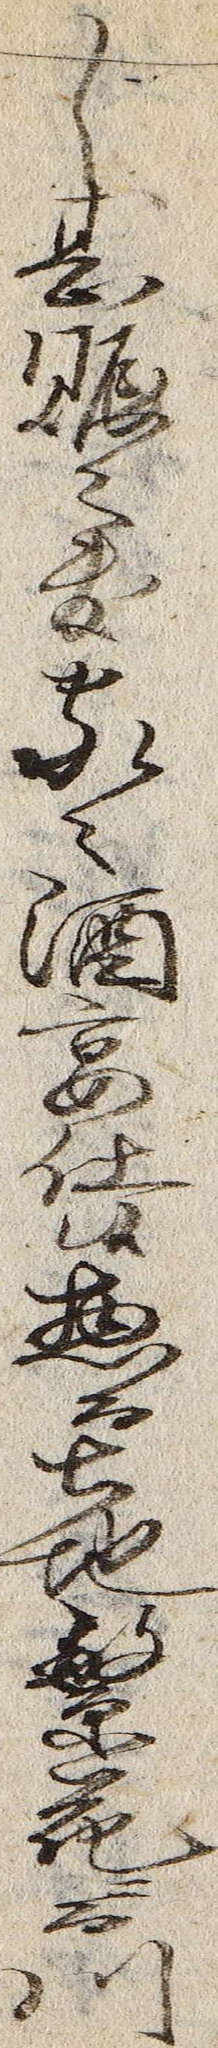し甚賑々しく家々酒宴仕候惣て土地繁花にて川
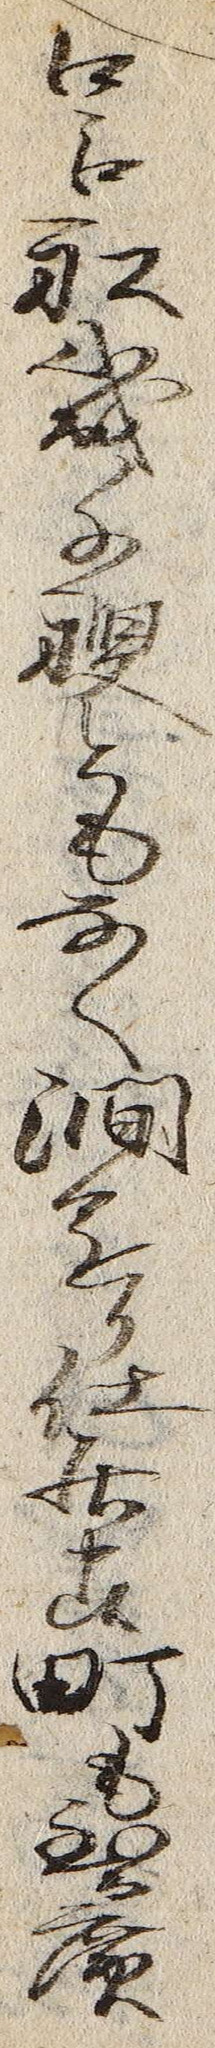口へ船幾千艘ともなく澗懸り仕居申候町も至て広
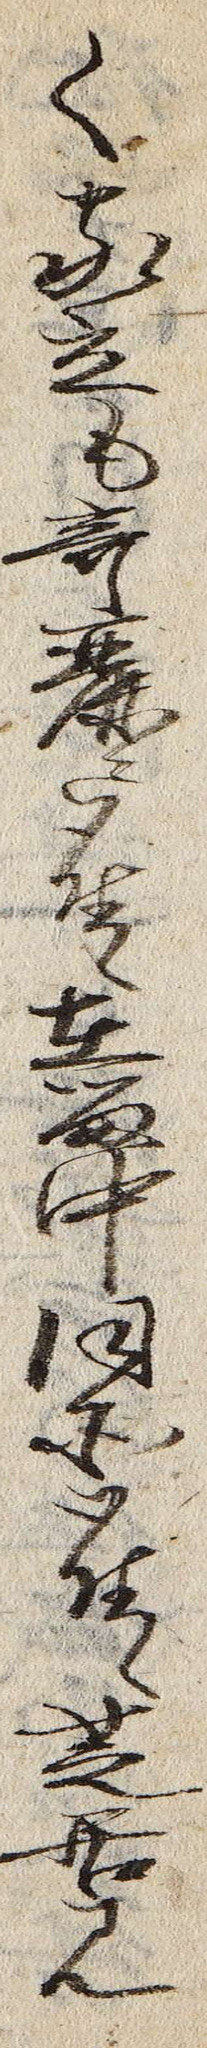く家立も奇麗に御座候在留中同所御座候芝居見
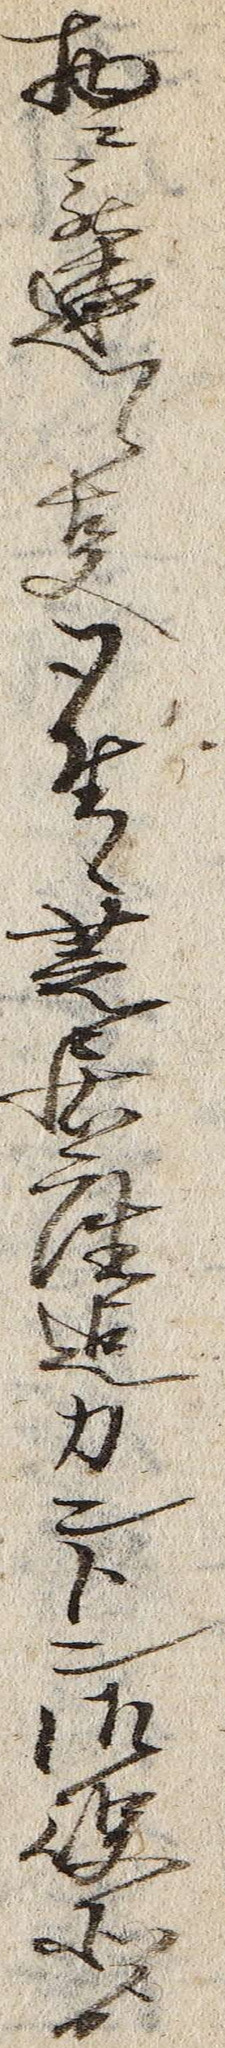物に被連候事御座候芝居座までカントン御役所より
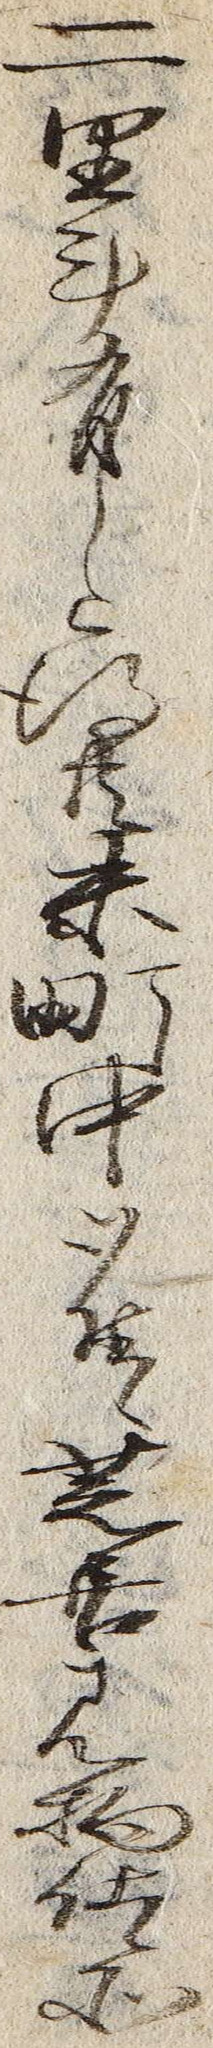二里斗有之候得ども未町中御座候芝居見物仕候所
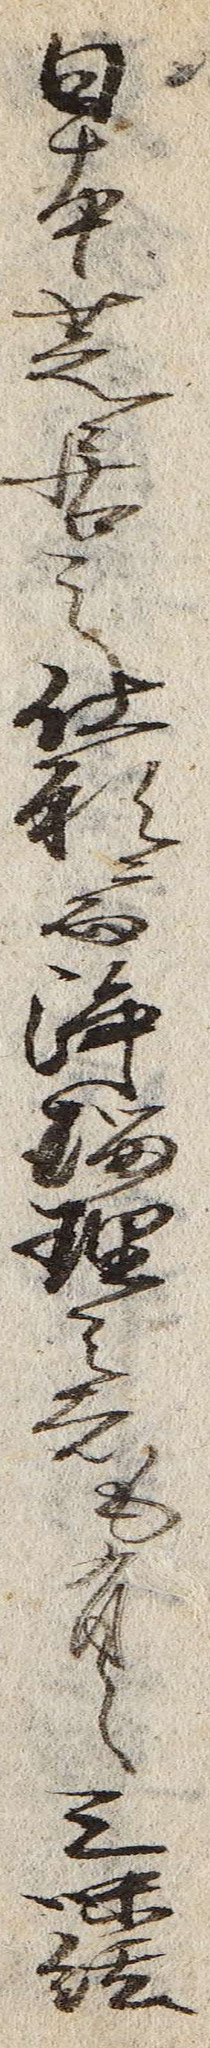日本芝居の仕形にて浄瑠璃の物も有之三味絃
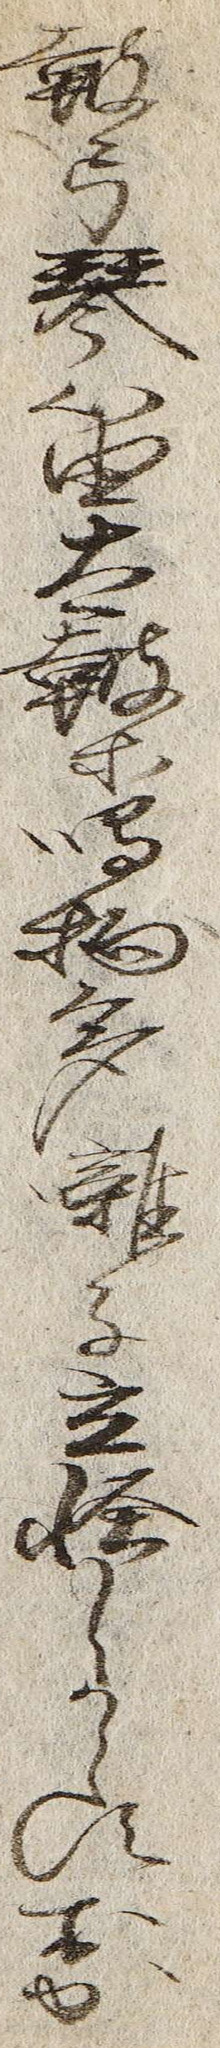鼓弓琴笛太鼓等鳴物多囃子立怪しからすおか
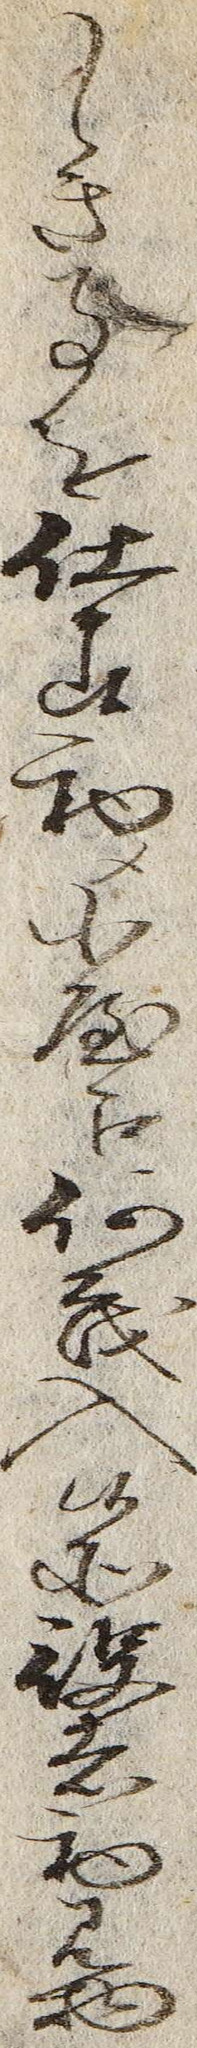しき事を仕申候初メ小屋へ何も入候所役者初見物
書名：能登国清兵衛異国江漂流之始末
